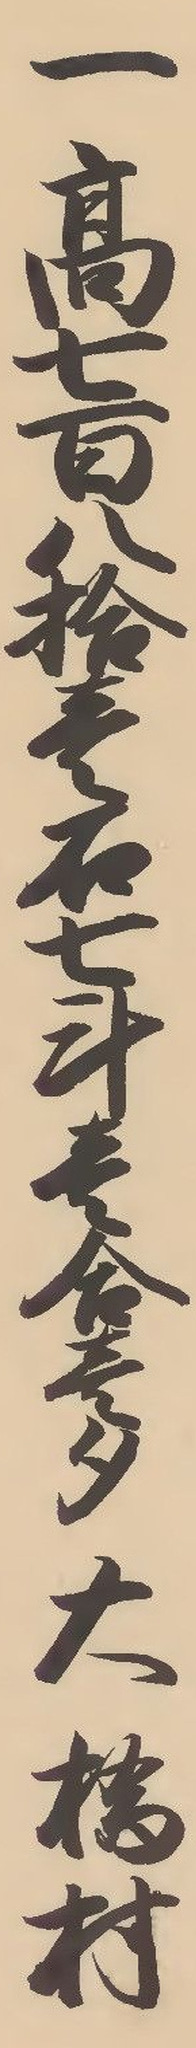一高七百八拾壱石七斗壱合壱勺大橋村

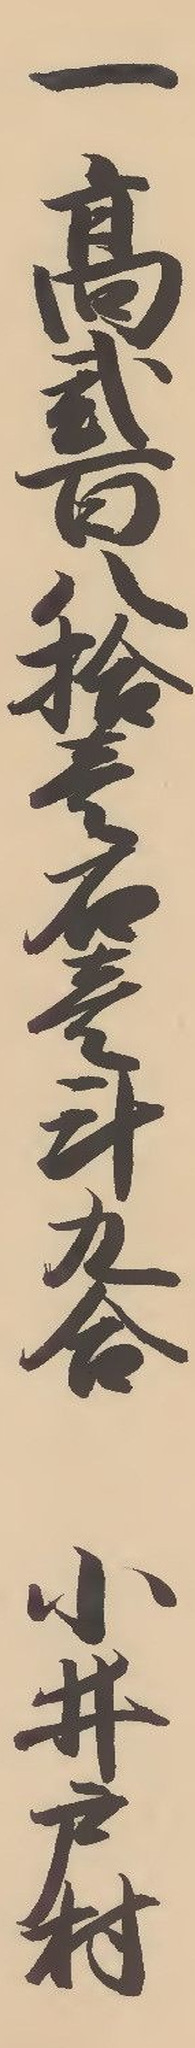一高弐百八拾壱石壱斗九合小井戸村
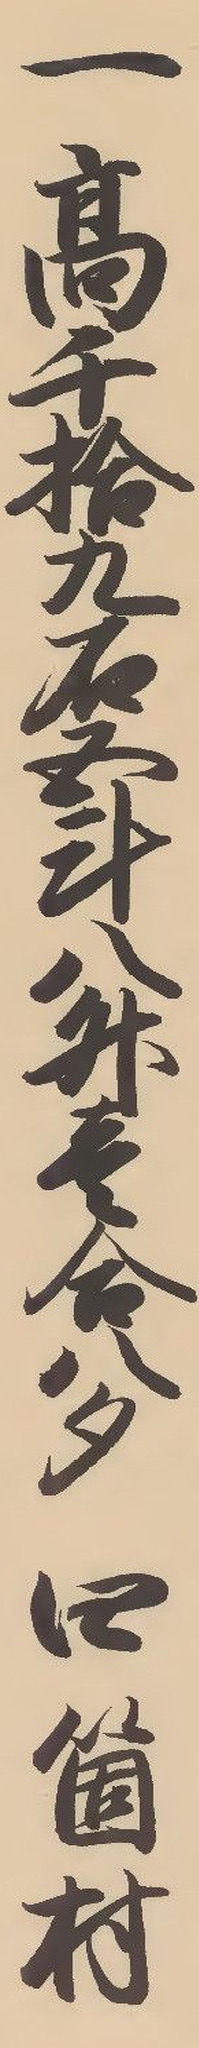一高千拾九石五斗八升壱合八勺四箇村
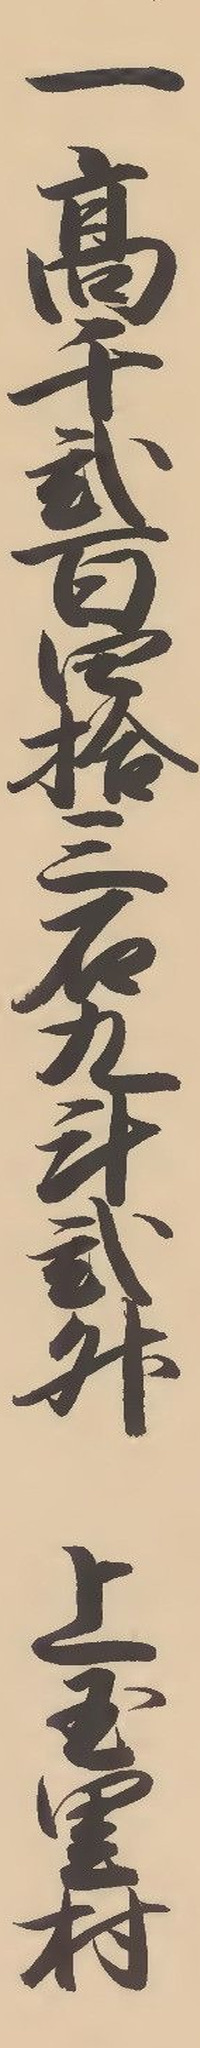一高千弐百四拾三石九斗弐升上玉里村
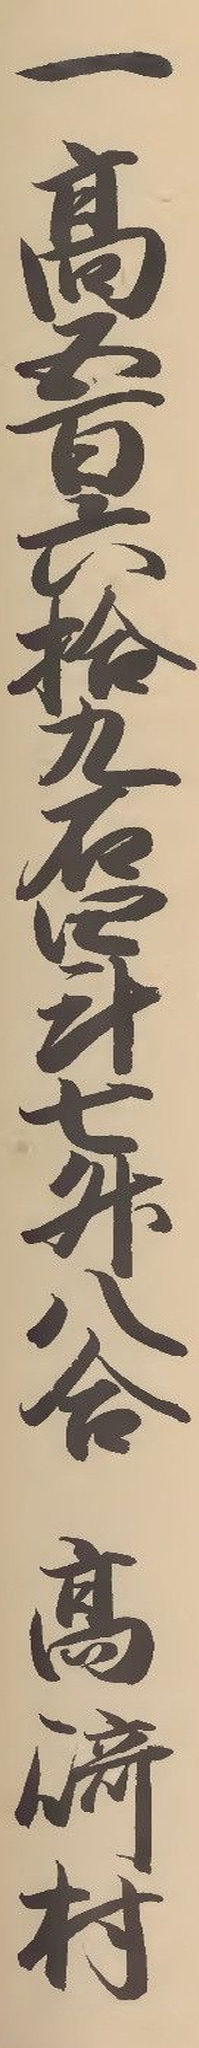一高五百六拾九石四斗七升八合高崎村
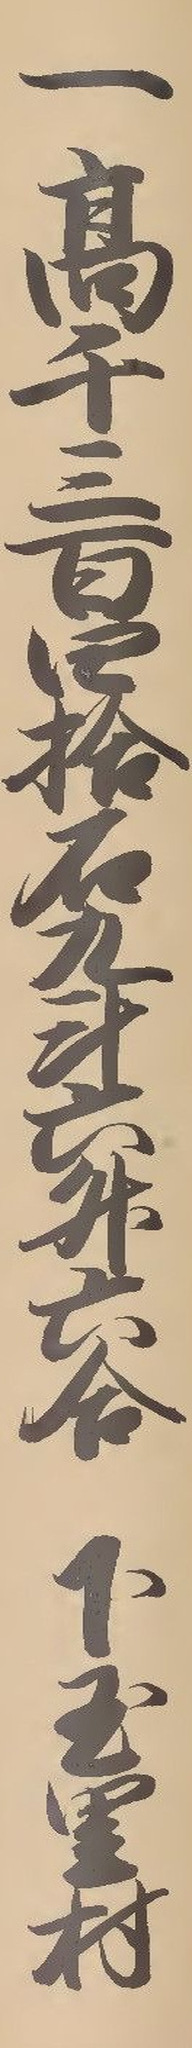一高千三百四拾石九斗六升六合下玉里村
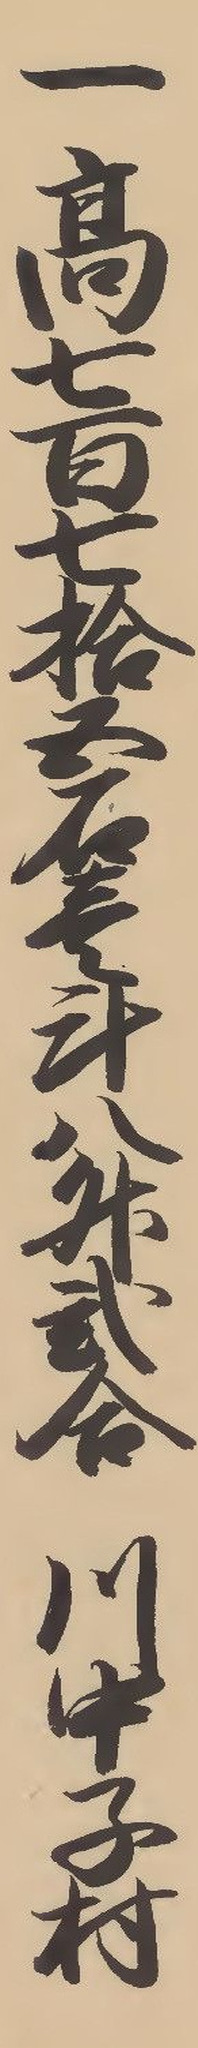一高七百七拾五石壱斗八升弐合川中子村
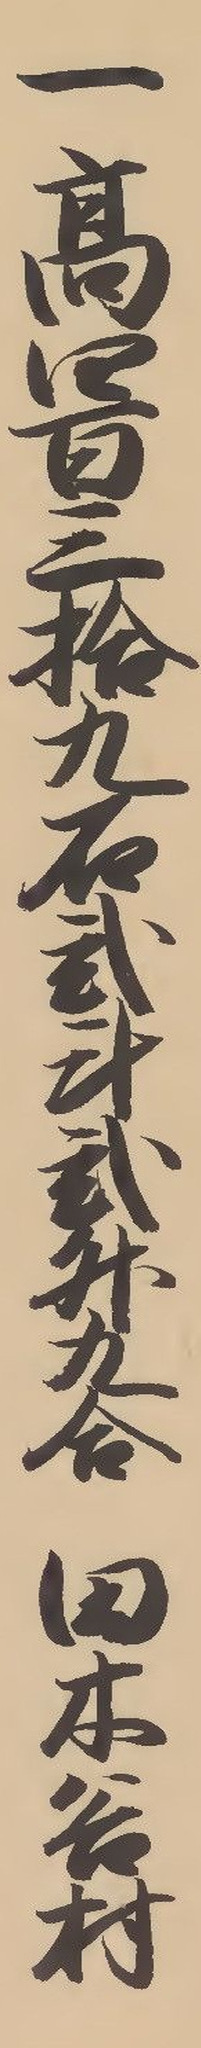一高四百三拾九石弐斗弐升九合田木谷村
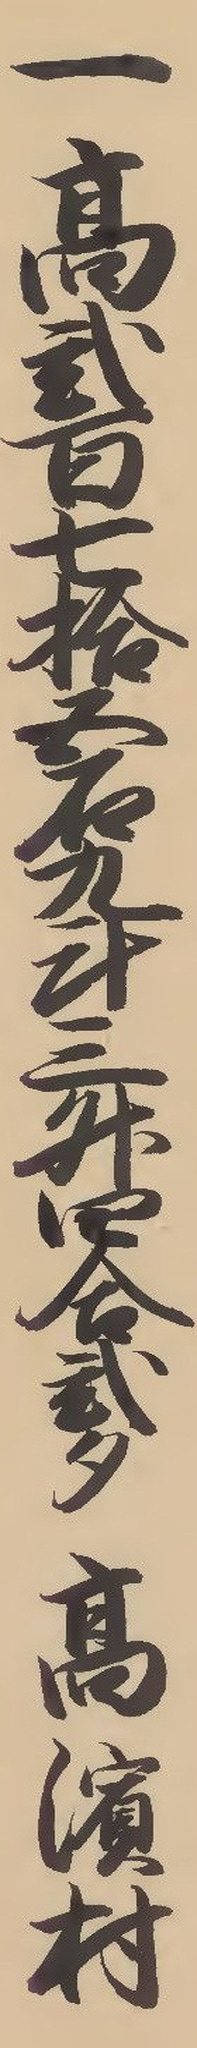一高弐百七拾五石九斗三升四合弐勺高浜村

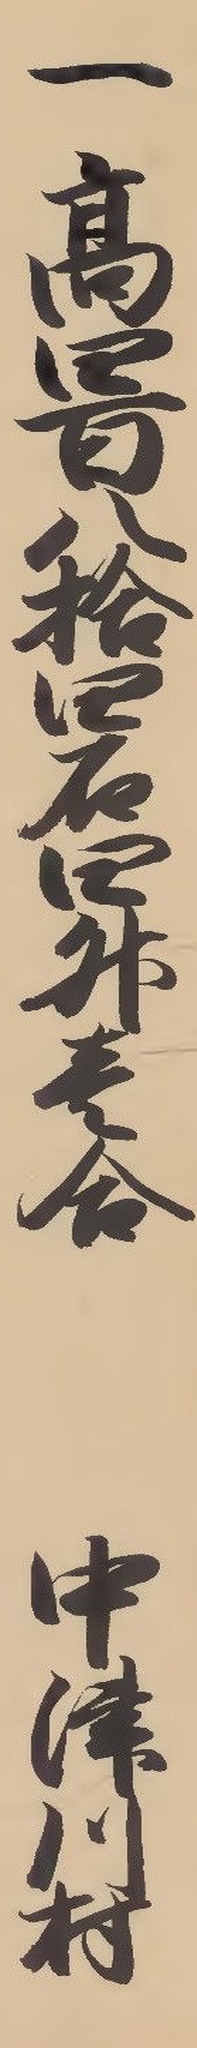一高四百八拾四石四升壱合中津川村
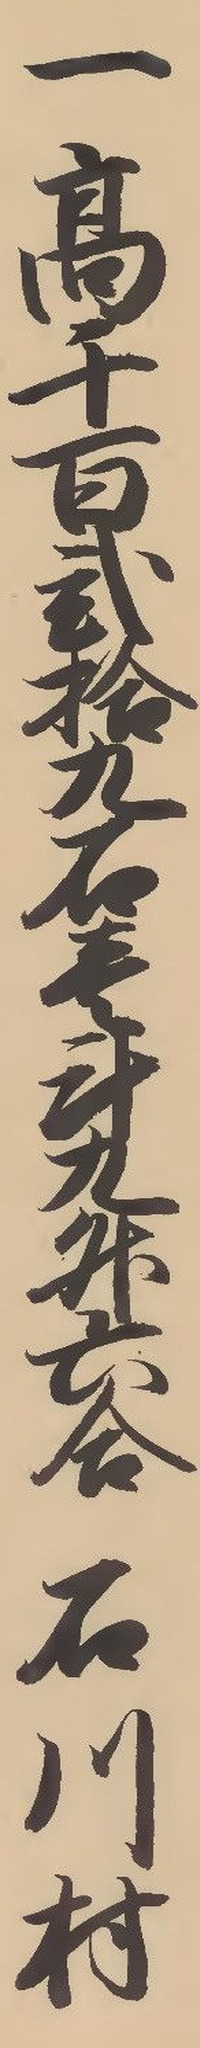一高千百弐拾九石壱斗九升六合石川村
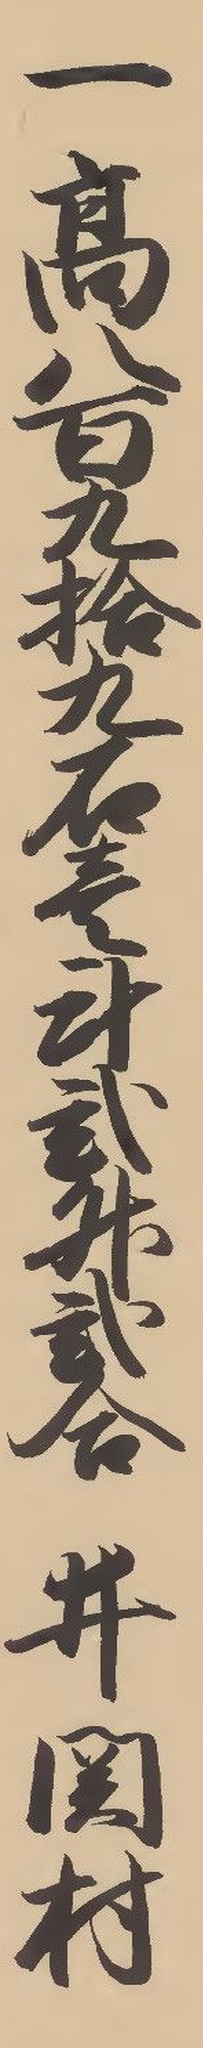一高八百九拾九石壱斗弐升弐合井関村
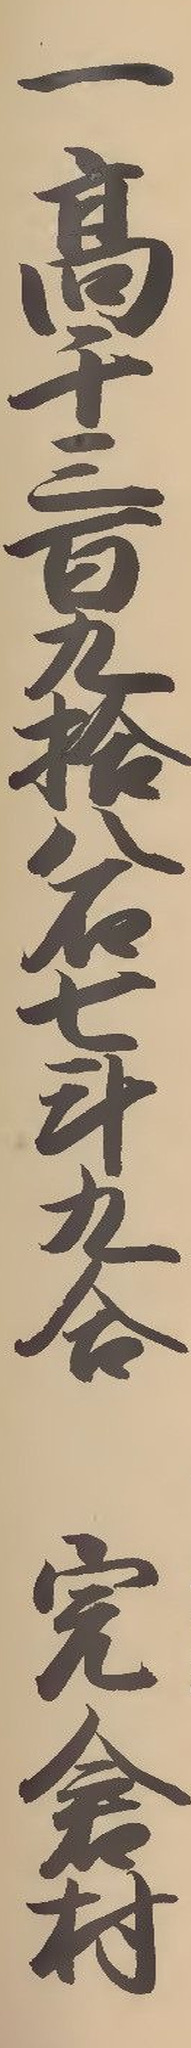一高千三百九拾八石七斗九合完倉村
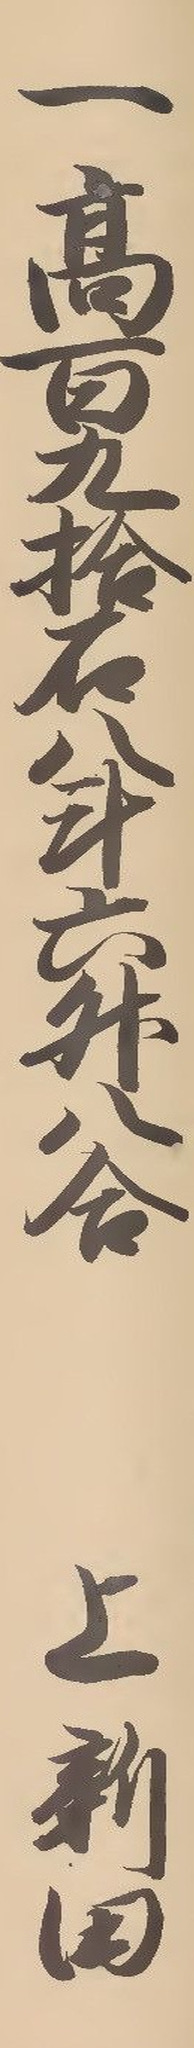一高百九拾石八斗六升八合上新田
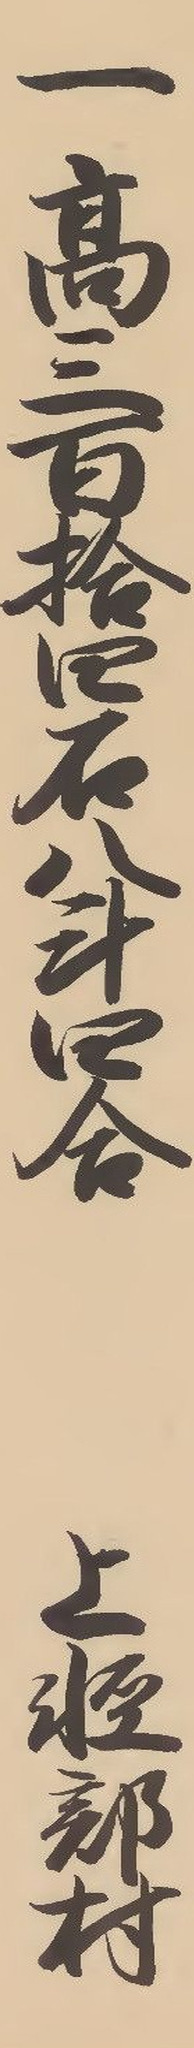一高三百拾四石八斗四合上軽部村
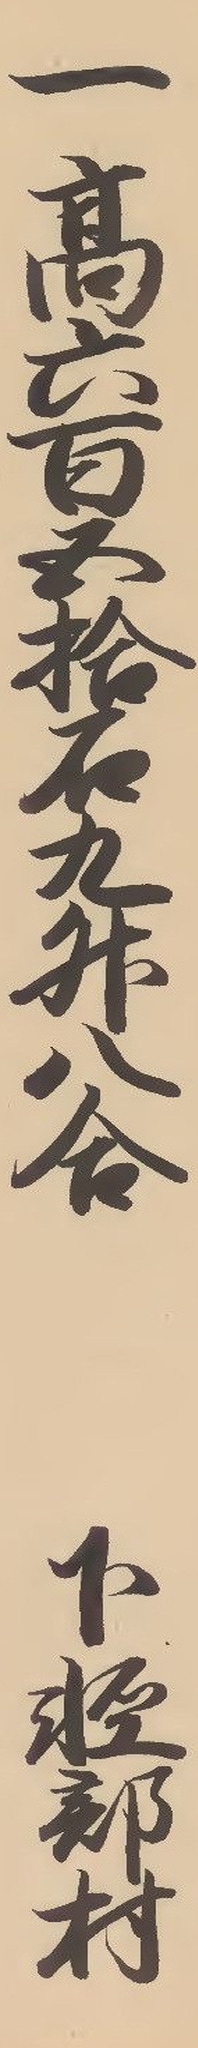一高六百五拾石九升八合下軽部村
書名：常陸国郷帳
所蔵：国立公文書館 National Archives of Japan
